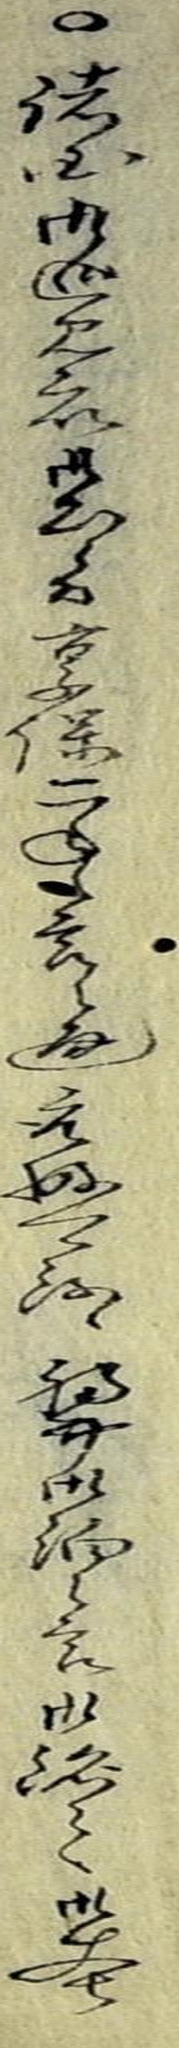〇諸国御巡見衆御出ニ付享保二年之節之通取扱可致候福井御泊之節御銘々へ御使者
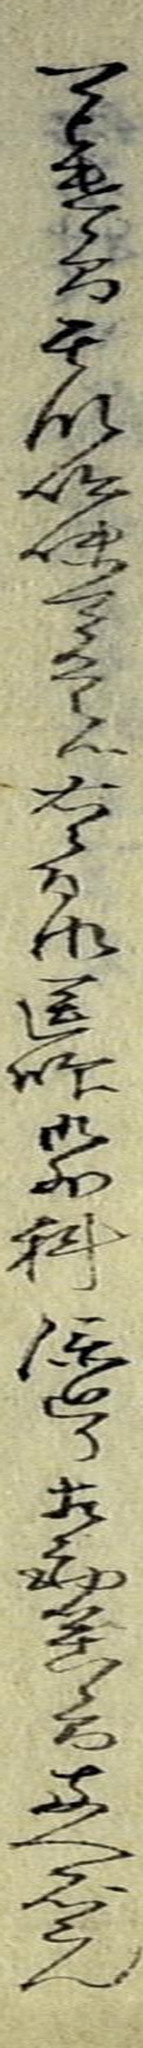可被遣候間其段吟味可有之候右ニ付御医師御外科添廻り相勤筈候間両人名元
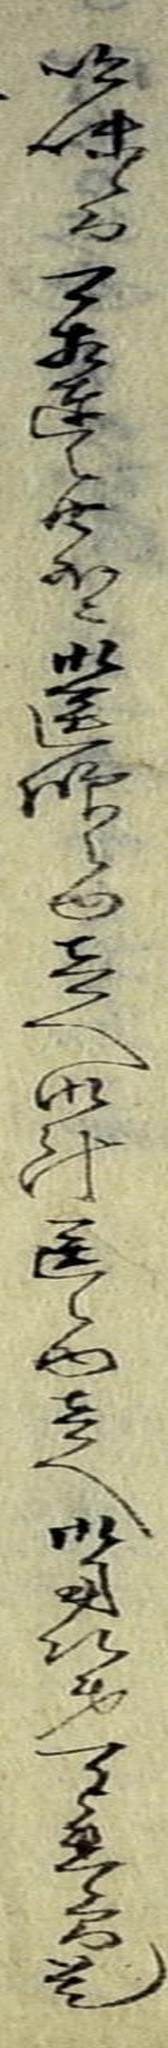吟味候而可相達候由外ニ御医師之内壱人御針医之内壱人御用次第可被遣候間是
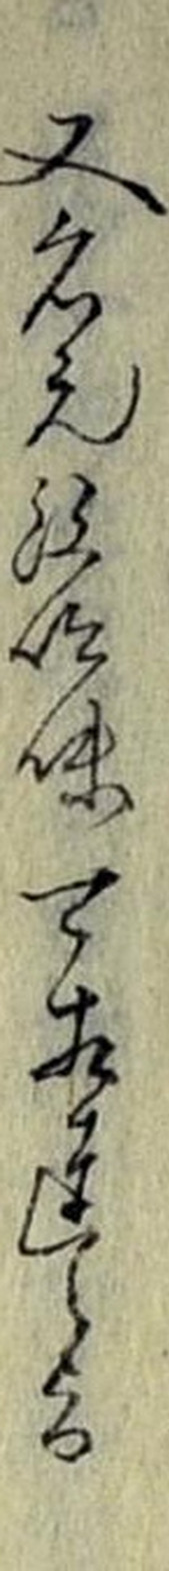又名元致吟味可相達之旨
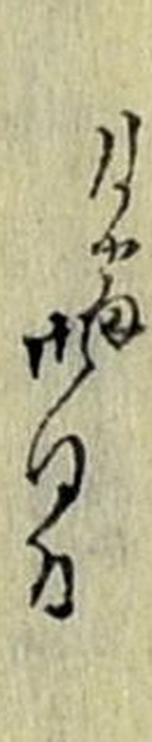月番御目付
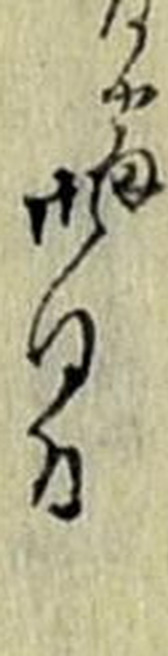御目付
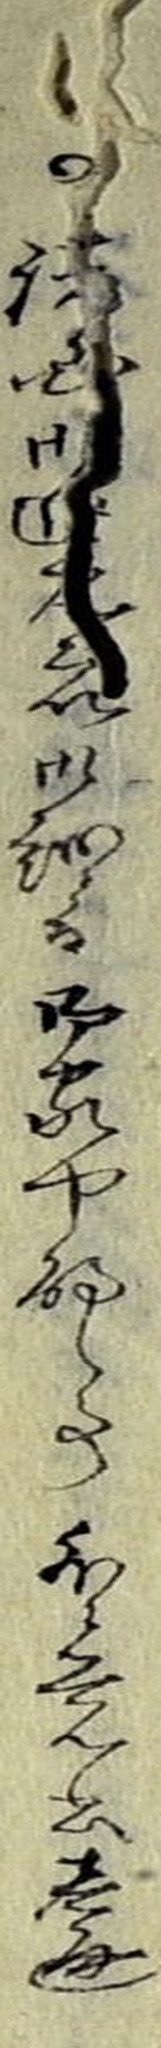〇諸国御巡見衆御越候ニ付御家中触候事外ニ覚書壱通
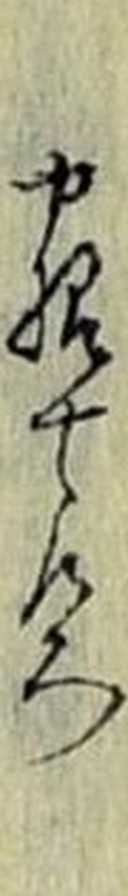中根十郎左衛門
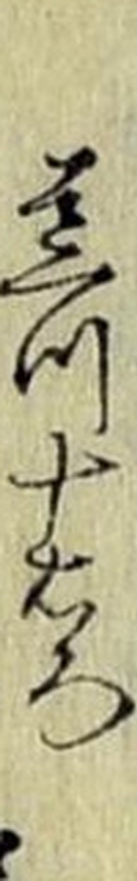荒川十右衛門差加
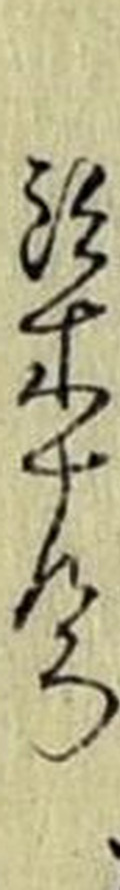鈴木十左衛門
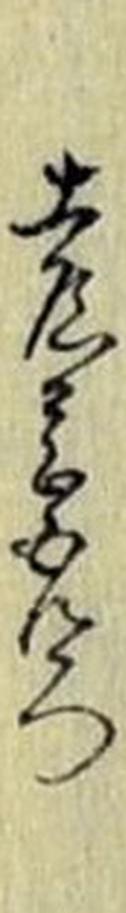土屋甚五左衛門
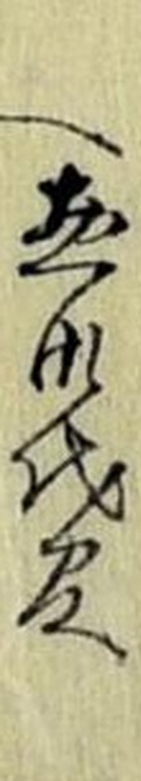惣御代官
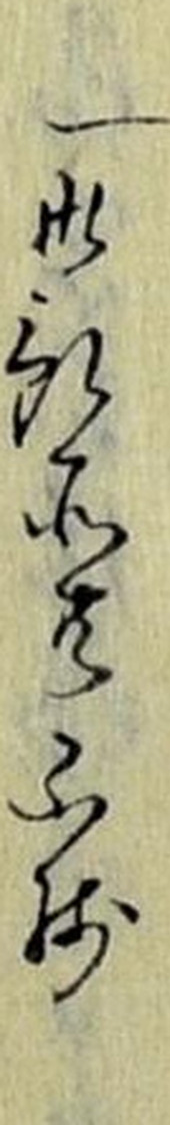御預所共不残
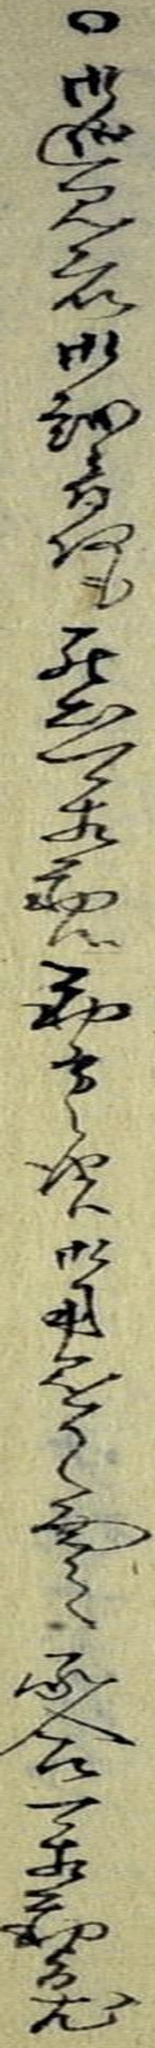〇御巡見衆御越候ニ付何も罷出可相勤候勤方之儀ハ御用懸り之面々へ承合可相勤旨尤
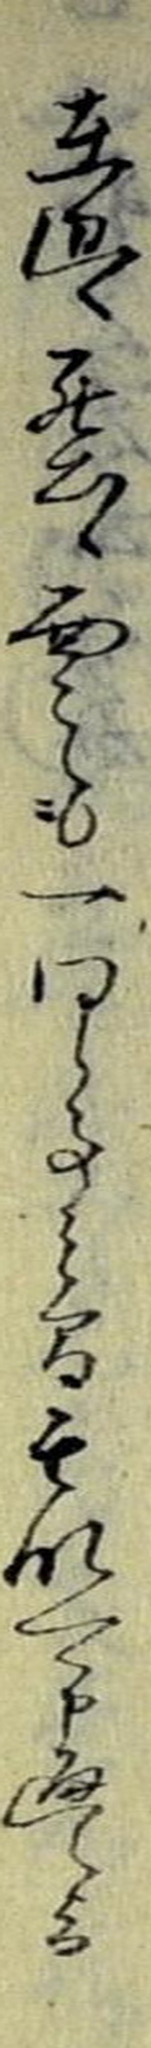在辺へ罷出候面々へも一同之事ニ候間其段可申通候旨
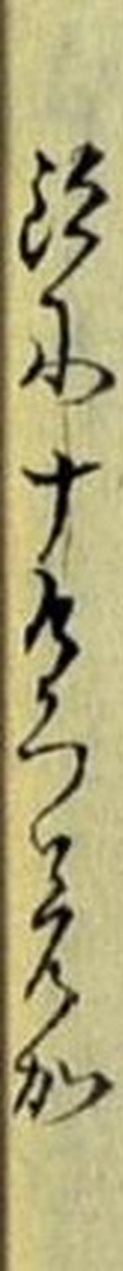鈴木十左衛門差加
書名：命令之部 一
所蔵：福井県文書館 Fukui Prefectural Archives
